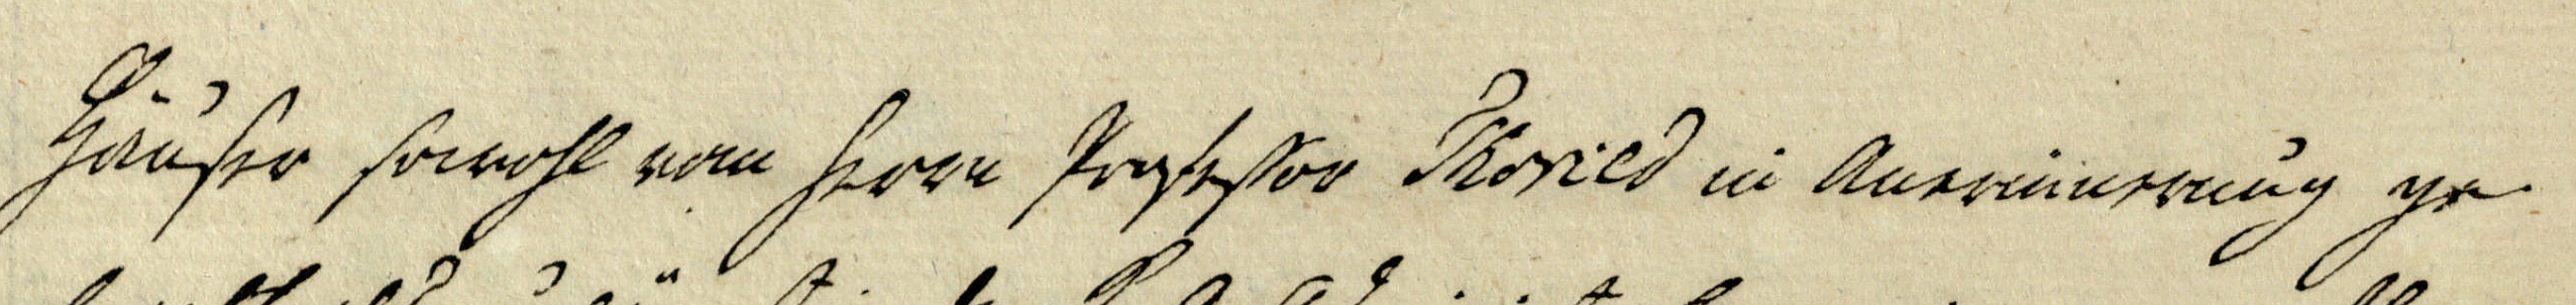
Häuser sowohl von Herrn Professor Thorild in Anerinnerung ge¬
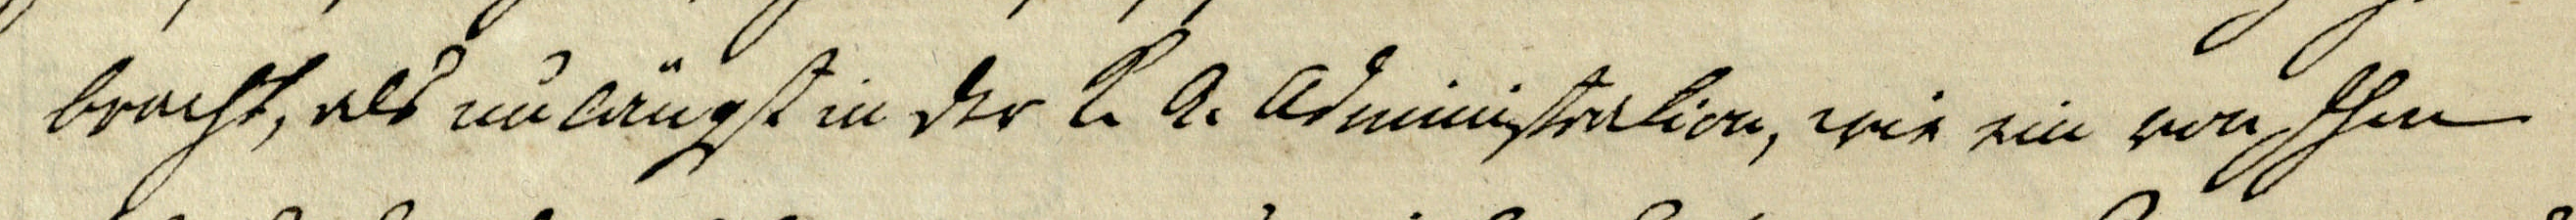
bracht, als unlängst in der K. A. Administration, wie ein von Ihm
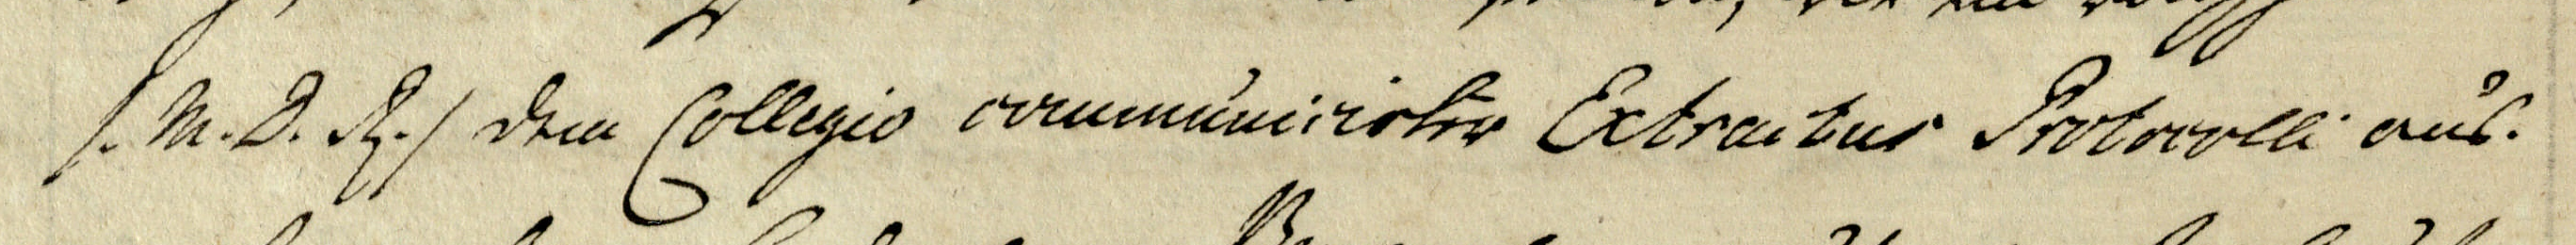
/. M. D. R. / dem Collegio communicirter Extractus Protocolli aus¬
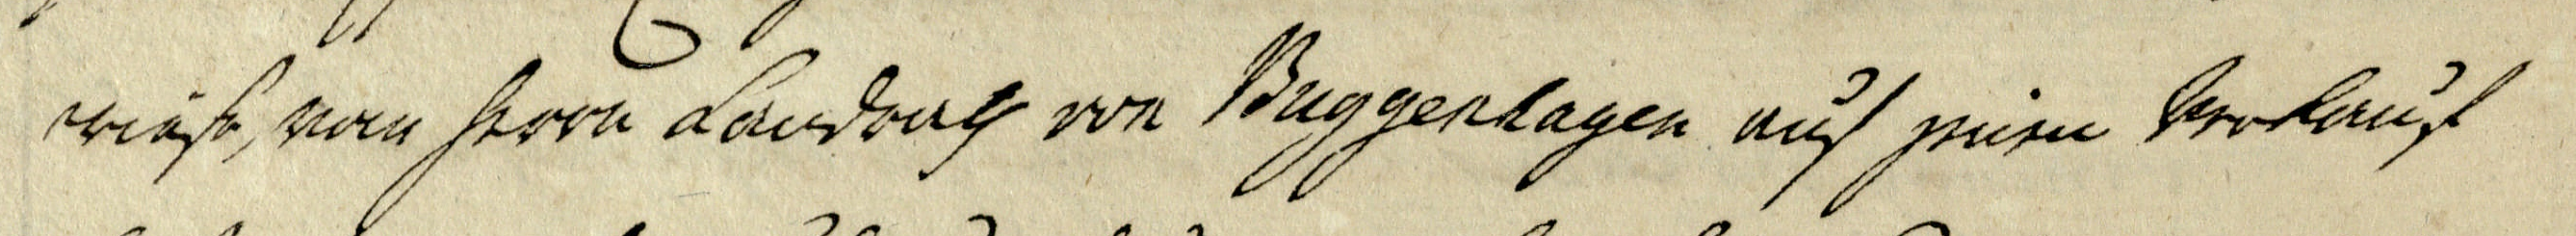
wiese, vom Herrn Landrath von Buggenhagen auf jenen Verkauf
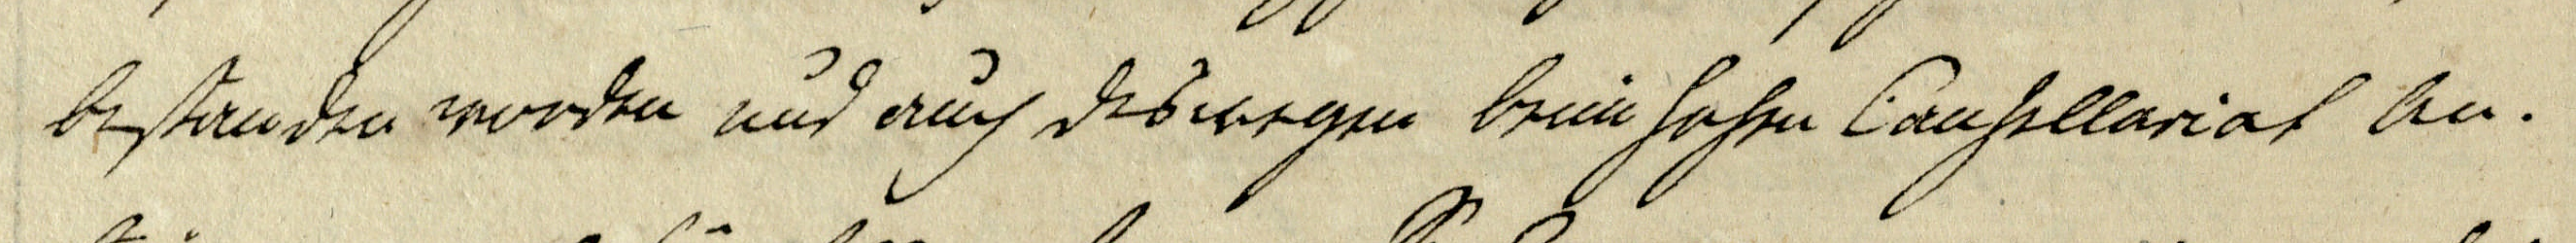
bestanden worden und auch des wegen beim hohen Canzellariat An¬
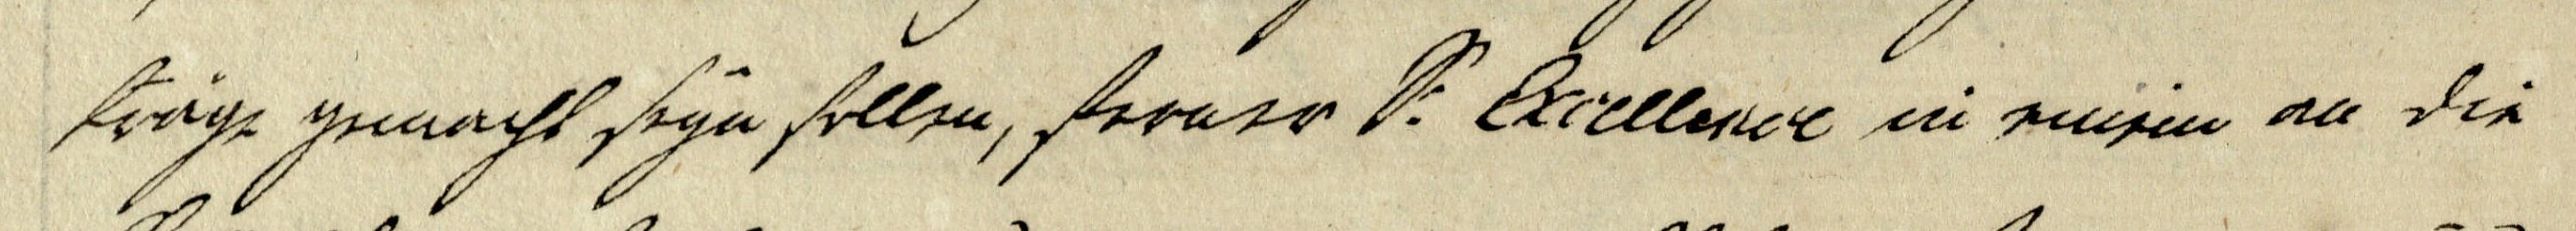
frage gemacht seÿn sollen, ferner Sr Excellence in einem an die
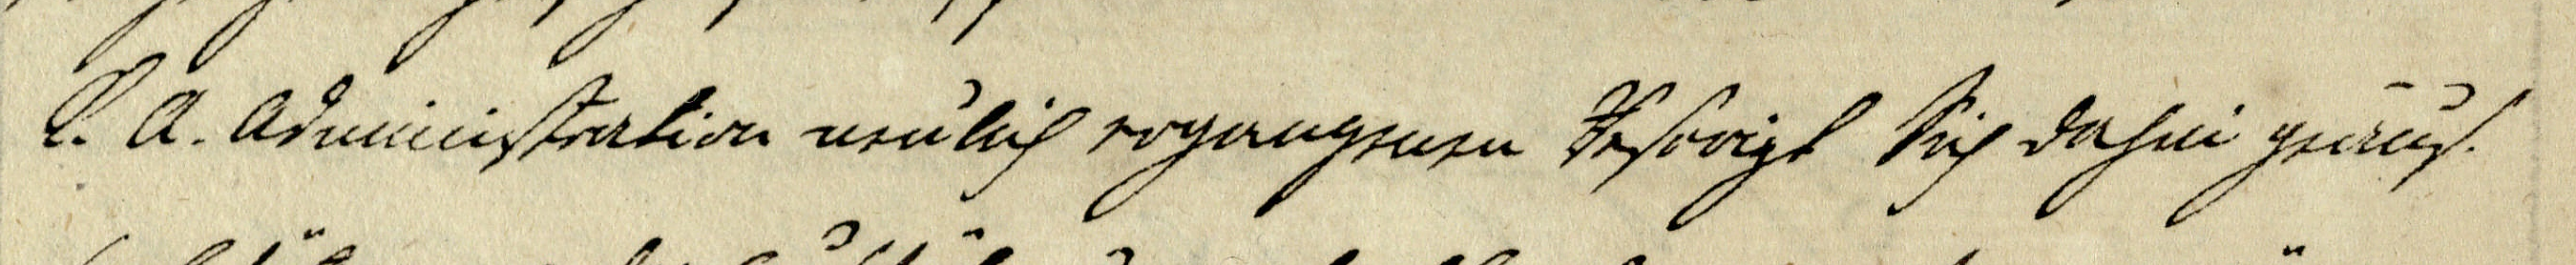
K. A. Administration neulich ergangenen Rescript Sich dahin geäus¬
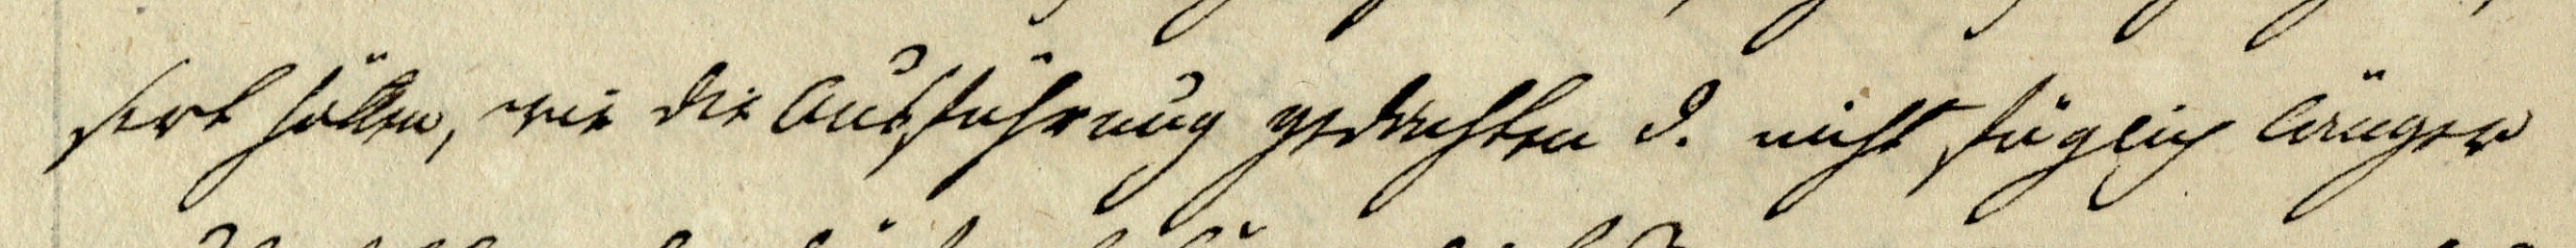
sert hätten, wie die Ausführung gedachten §. nicht füglich länger
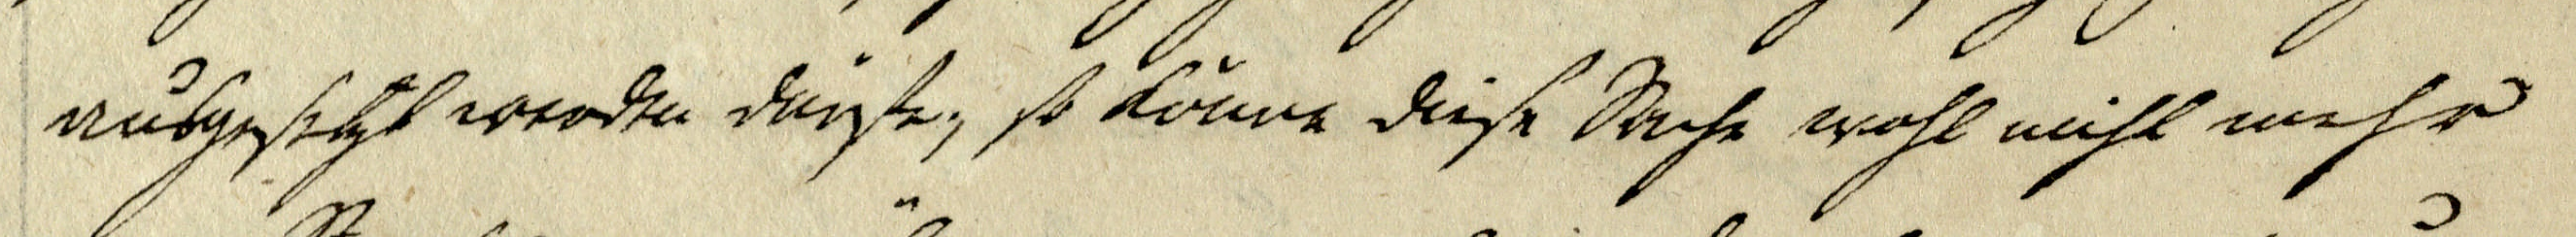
ausgesetzt werden dürfe, so könne diese Sache wohl nicht mehr
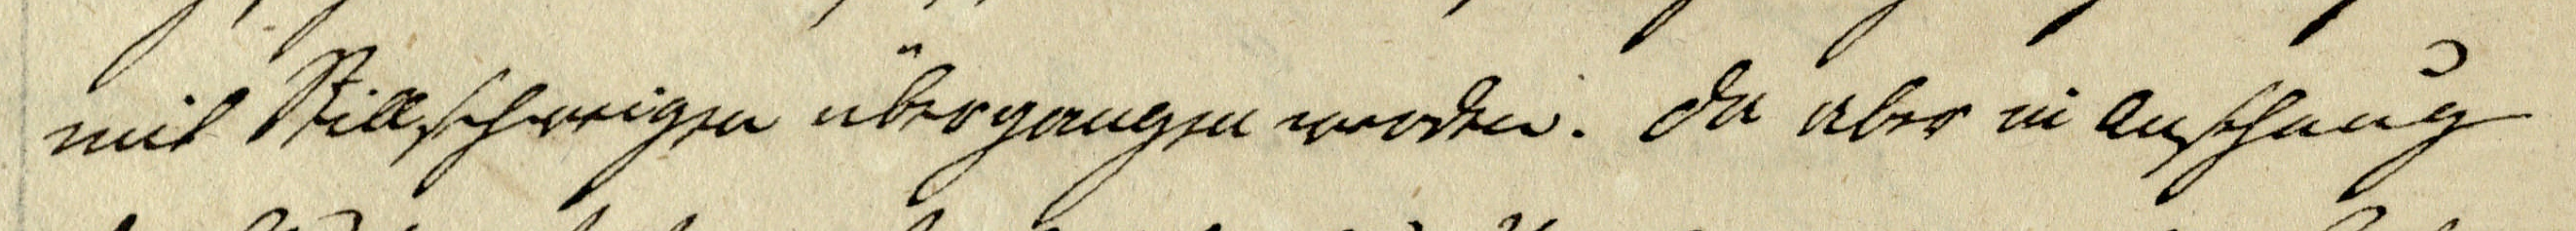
mit Stillschweigen übergangen werden. Da aber in Ansehung
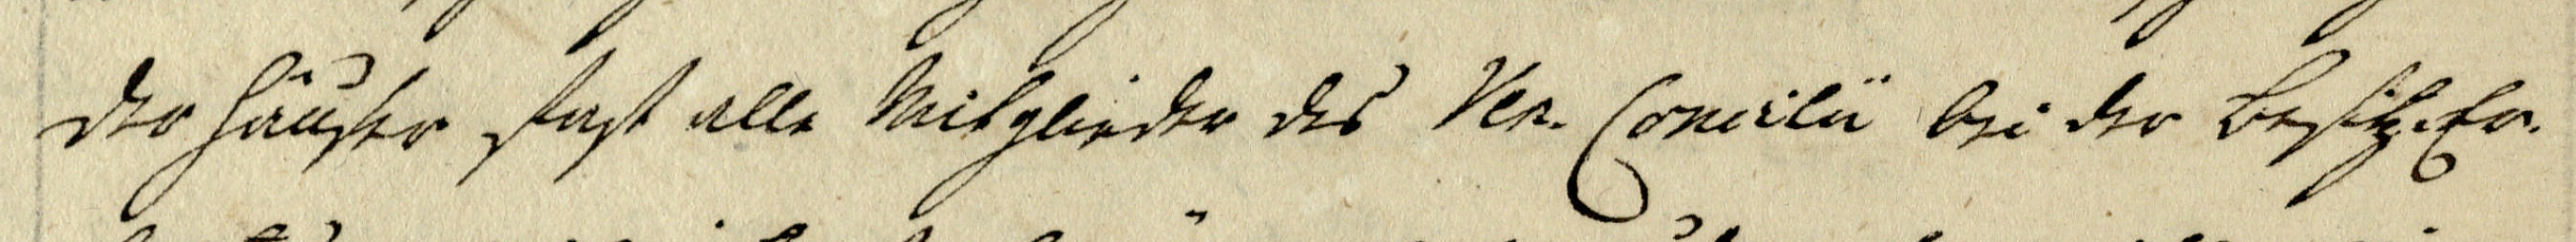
der Häuser fast alle Mitglieder des Ven. Concilio bei der Besitz Er¬
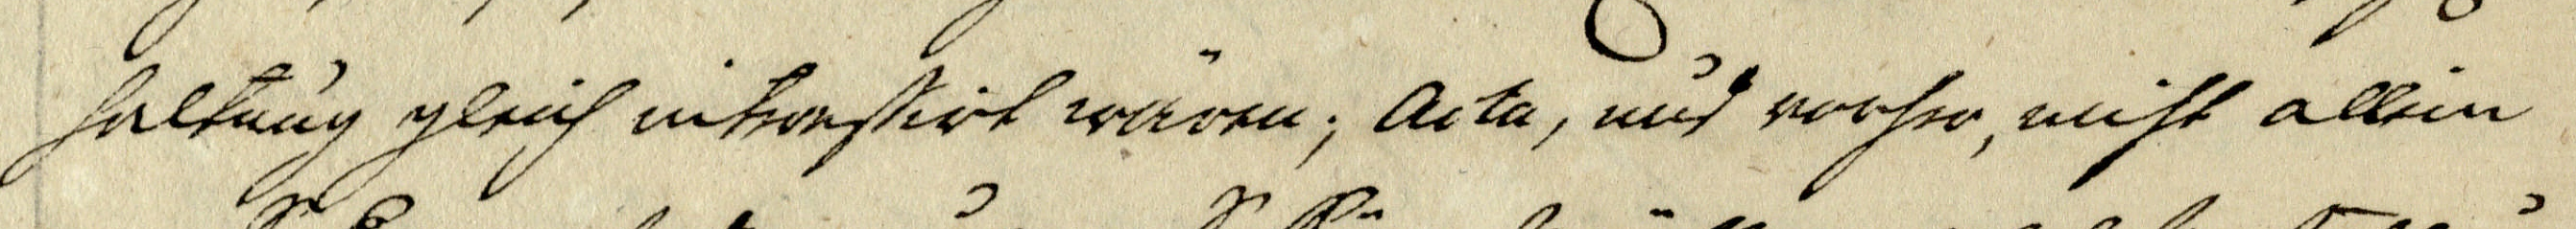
haltung gleich interessirt wären; Acta, und vorher, nicht allein
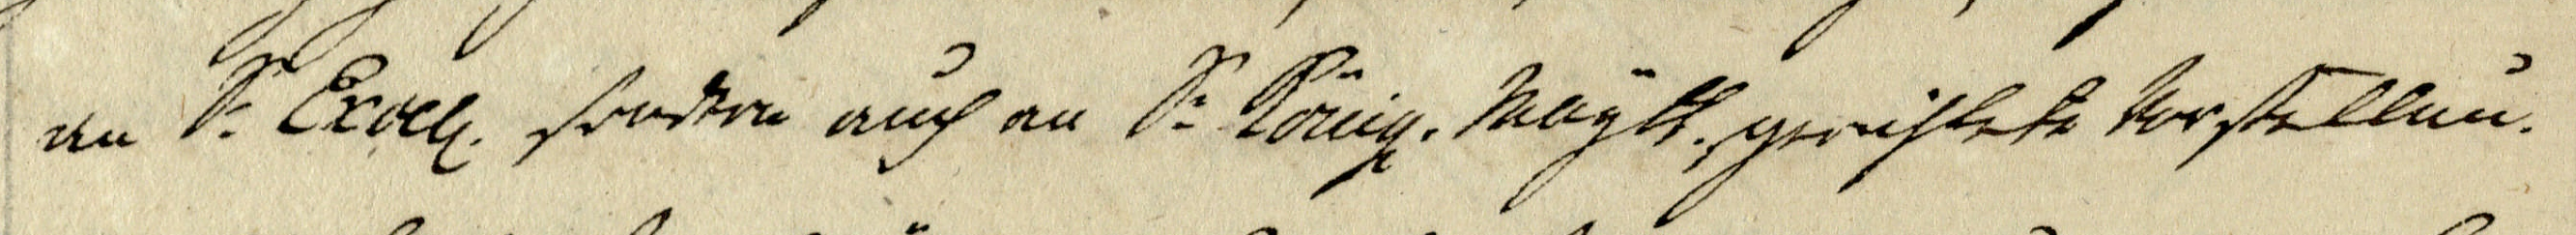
an Sr. Excel. sondern auch an Sr. König. Maÿtt. gerichtete Vorstellun¬
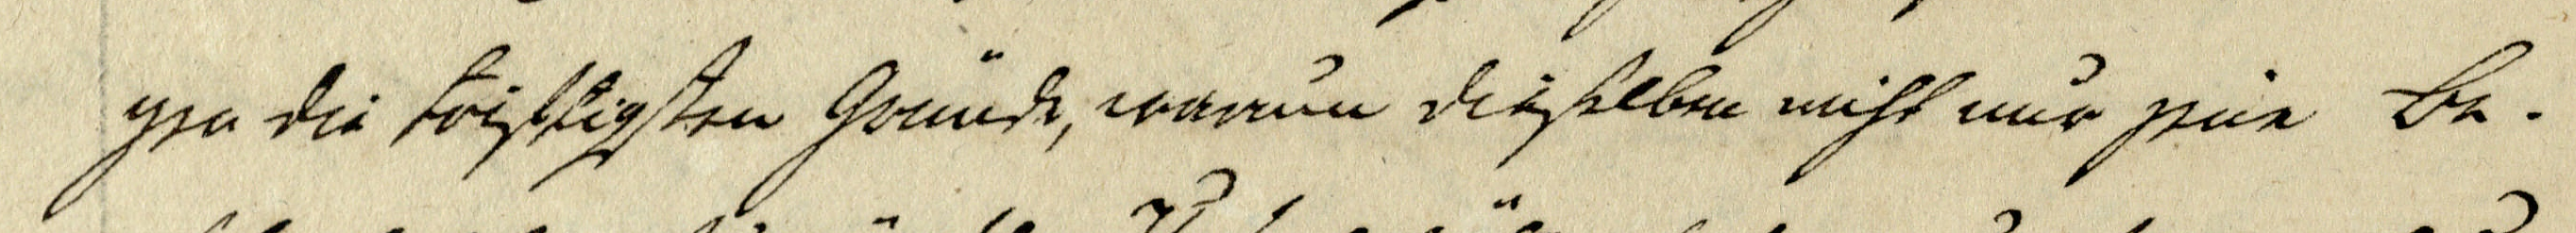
gen die triftigsten Gründe, warum dieselben nicht nur jene Be¬
